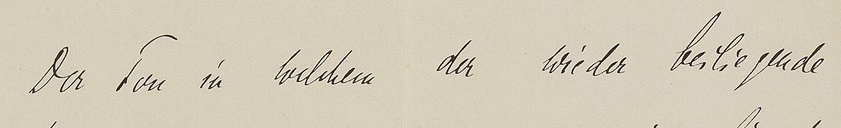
Der Ton in welchem der wieder beiliegende
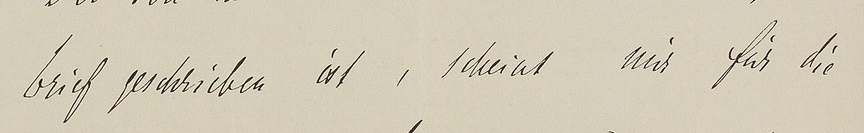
Brief geschrieben ist, scheint mir für die
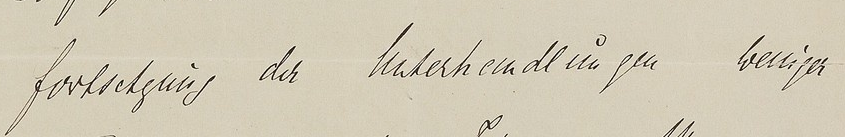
Fortsetzung der Unterhandlungen weniger
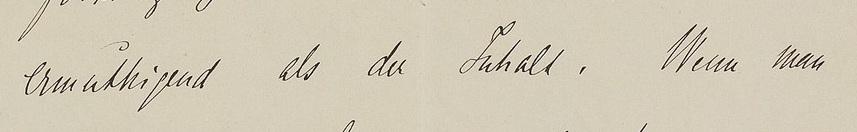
ermuthigend als der Inhalt. Wenn man
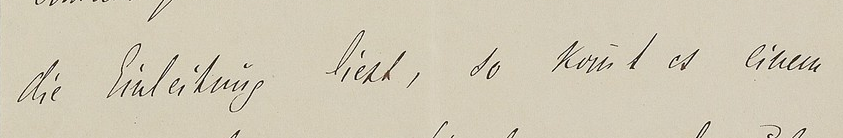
die Einleitung liest, so kommt es einem
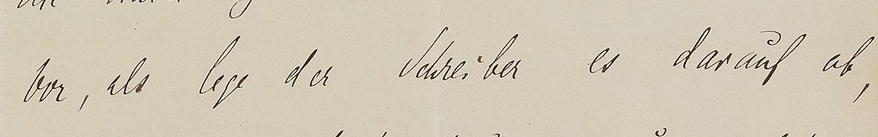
vor, als lege der Schreiber es darauf ab,
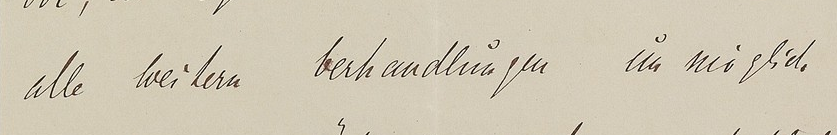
alle weitern Verhandlungen unmöglich
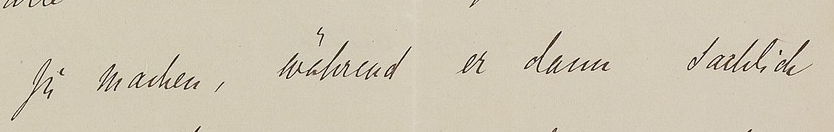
zu machen, während er dann sachlich
